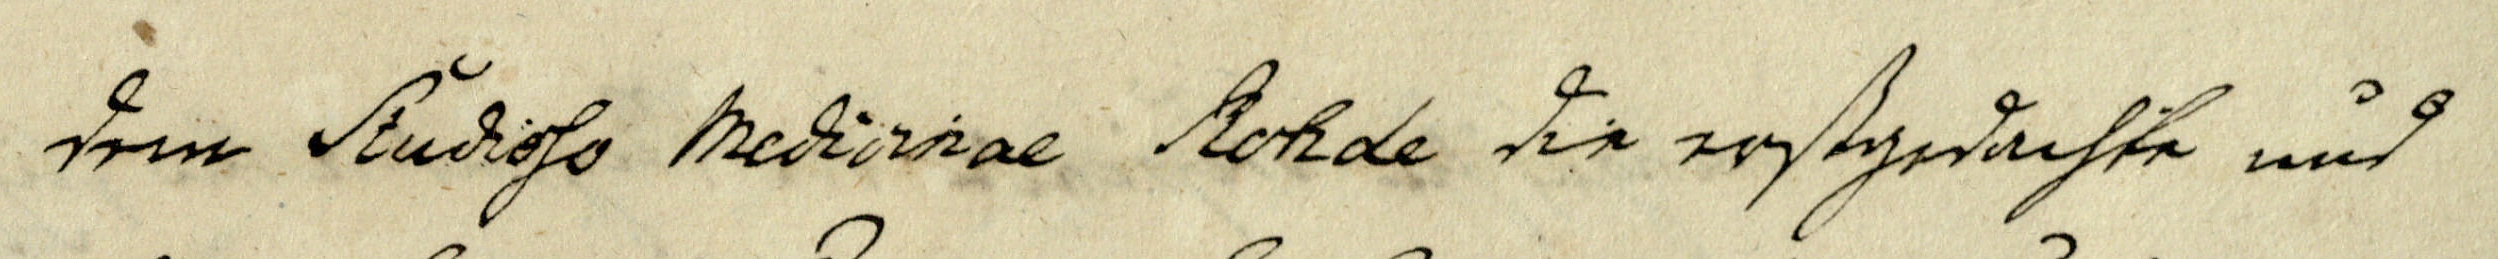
dem Studioso Medicinae Rohde die erstgedachte und
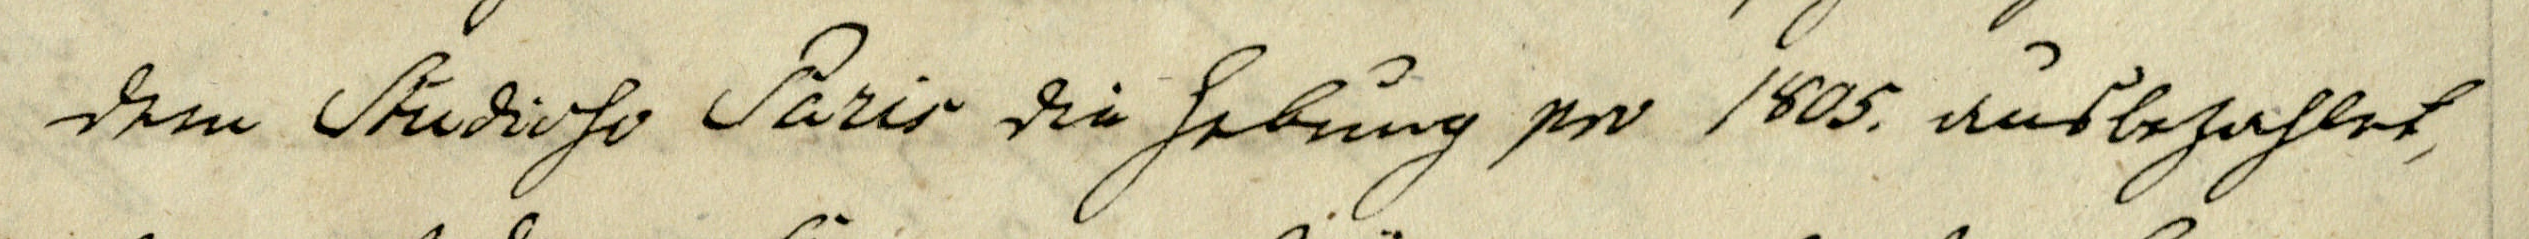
dem Studioso Paris die Hebung er 1805. ausbezahlet,
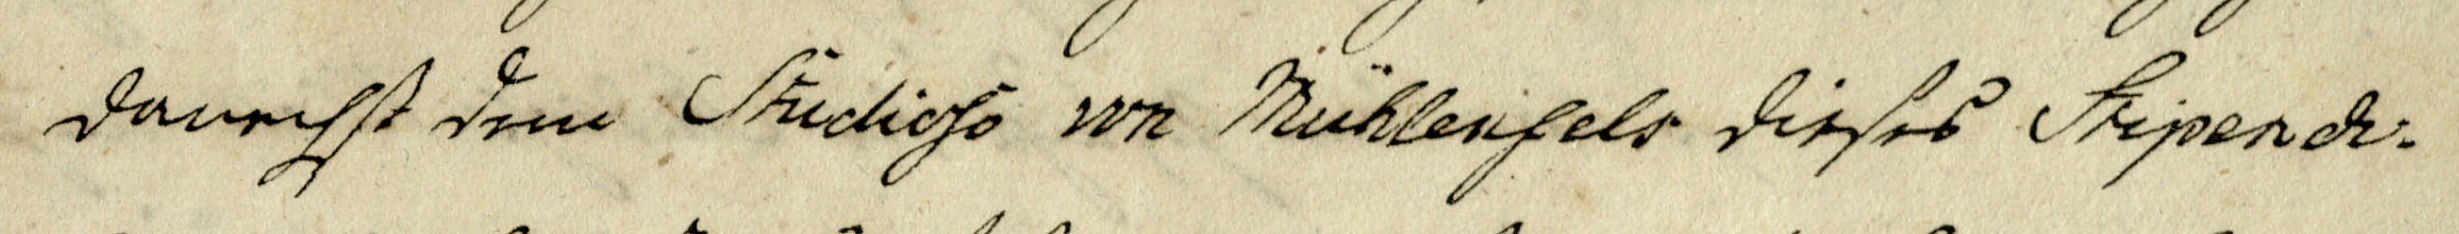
danechst dem Studioso von Muhlenfels dieses Stipendi¬
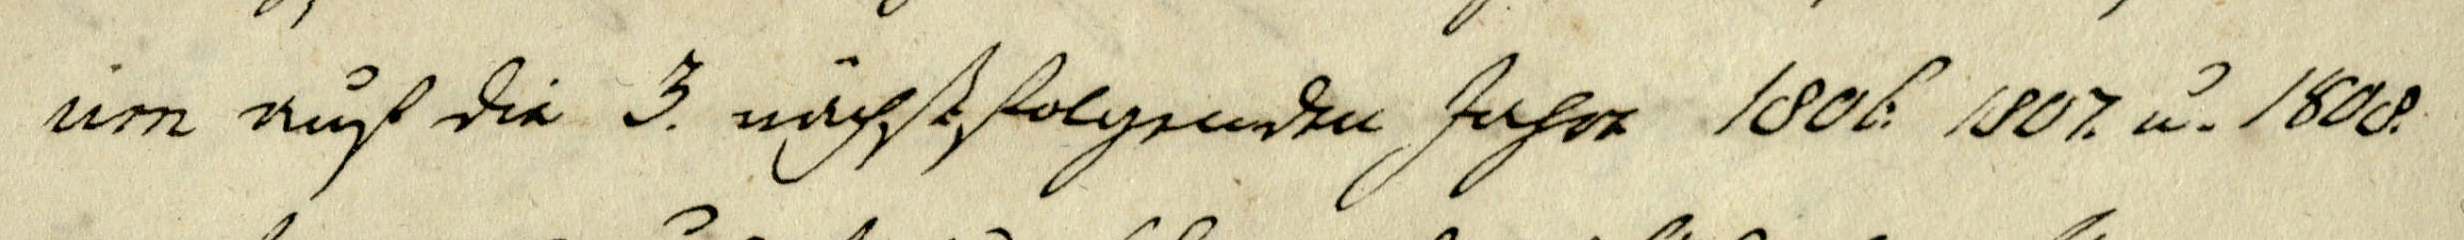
um auf die 3. nächstfolgenden Jahre 1806. 1807. u. 1808.
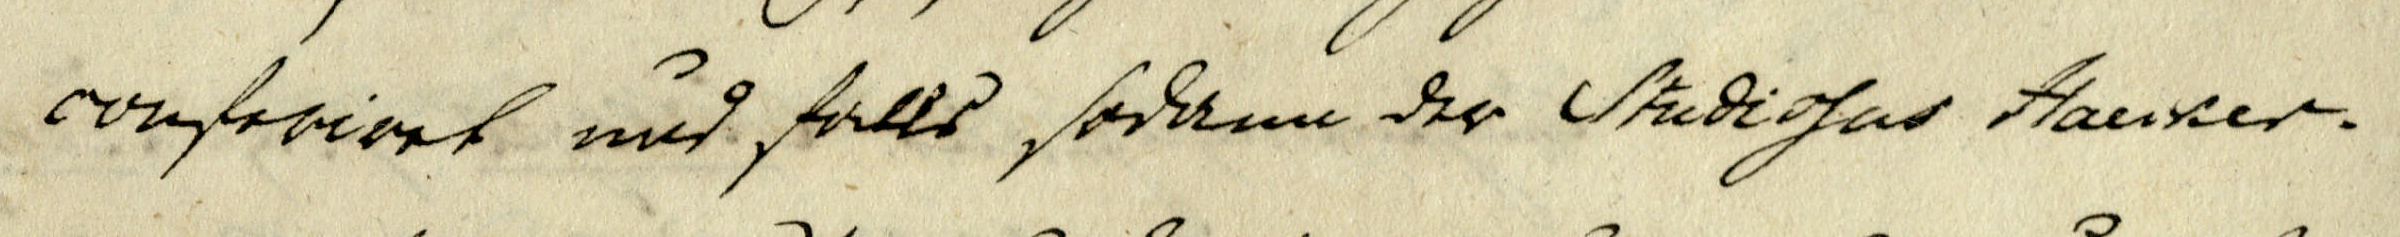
conferiret und falls sodann der Studiosus Haecker¬
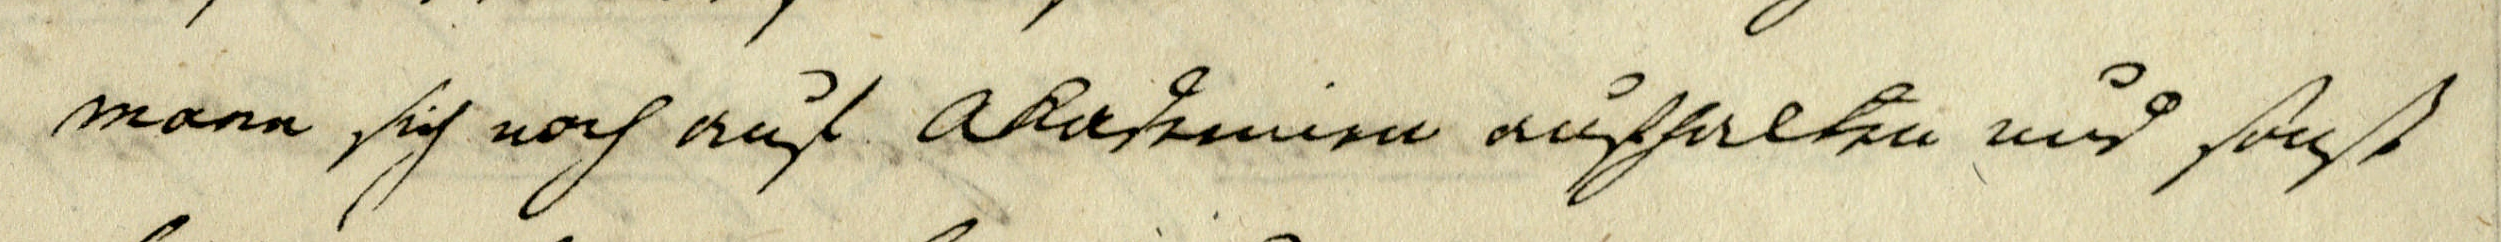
mann sich noch auf Akademien aufhalten und sonst
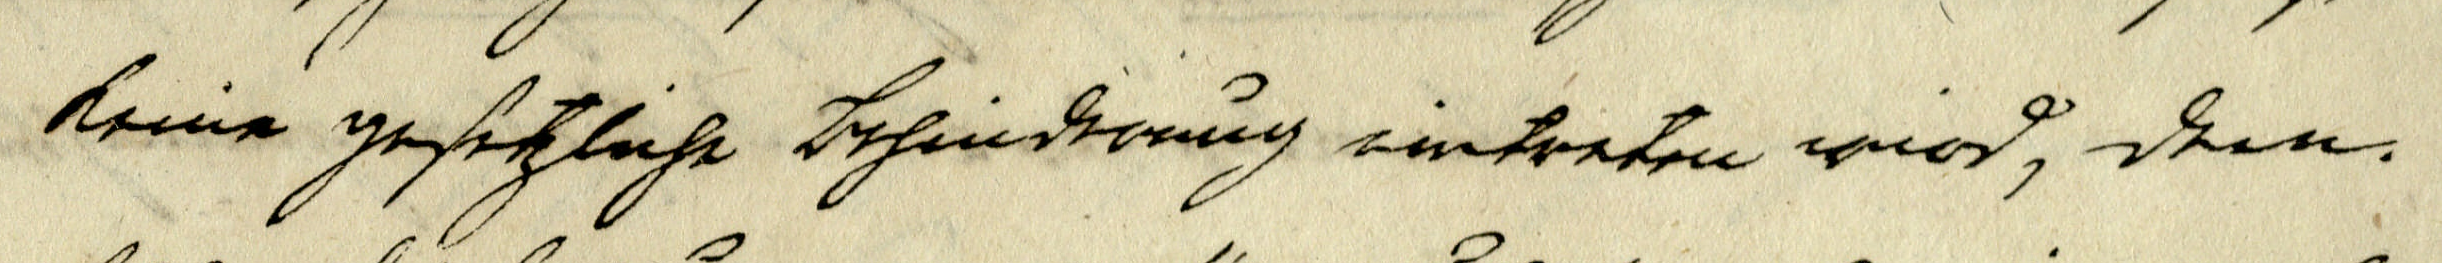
keine gesetzliche Behinderung eintreten wird, dem¬
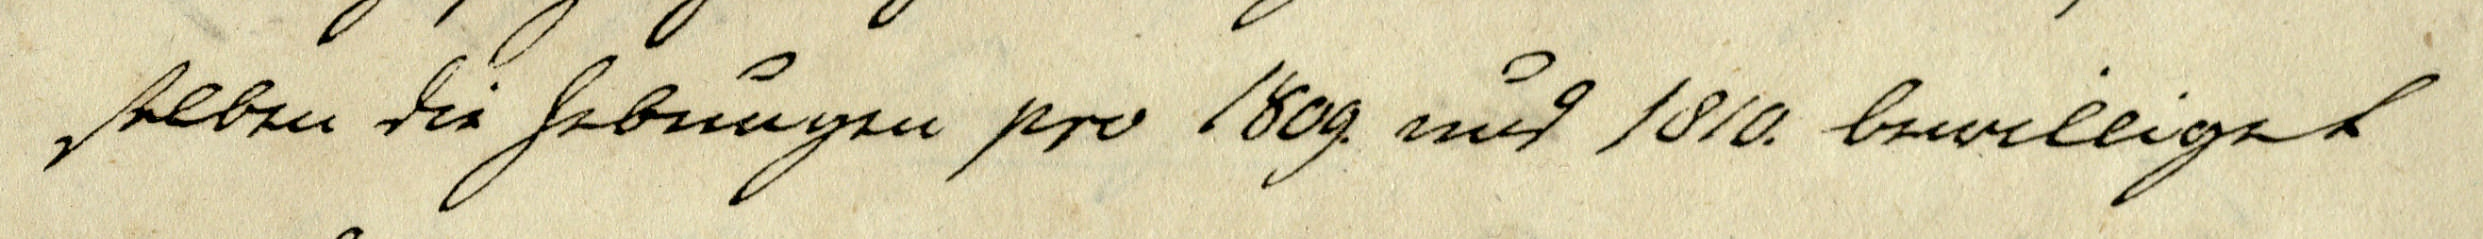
selben die Hebungen pro 1809. und 1810. bewilliget
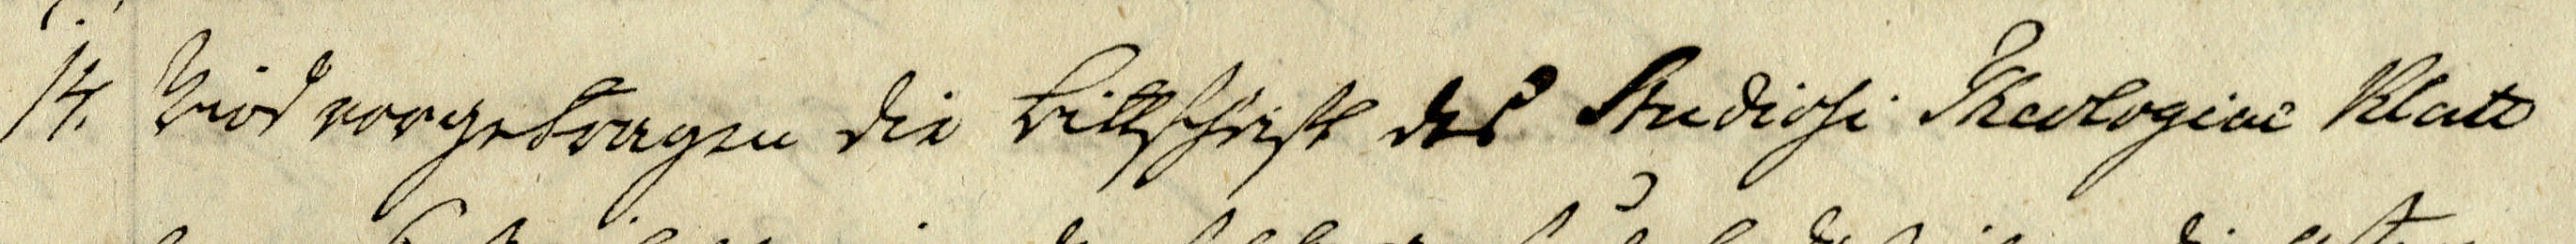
14. Wird vorgetragen die Bittschrift des Studiosi Theologiae Klatt
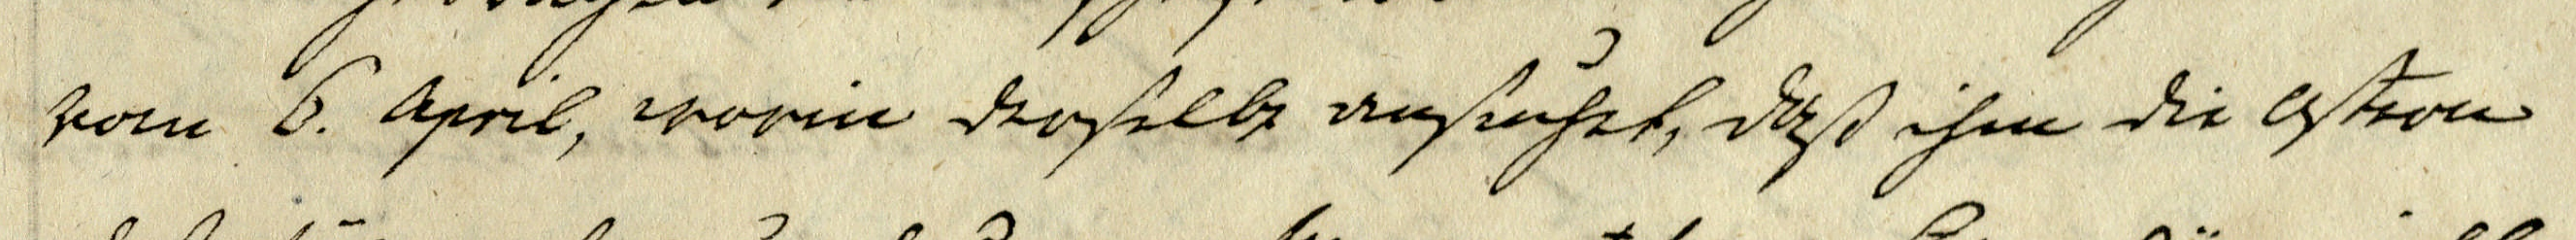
vom 6. April, worin derselbe ansuchet, daß ihm die Ostern
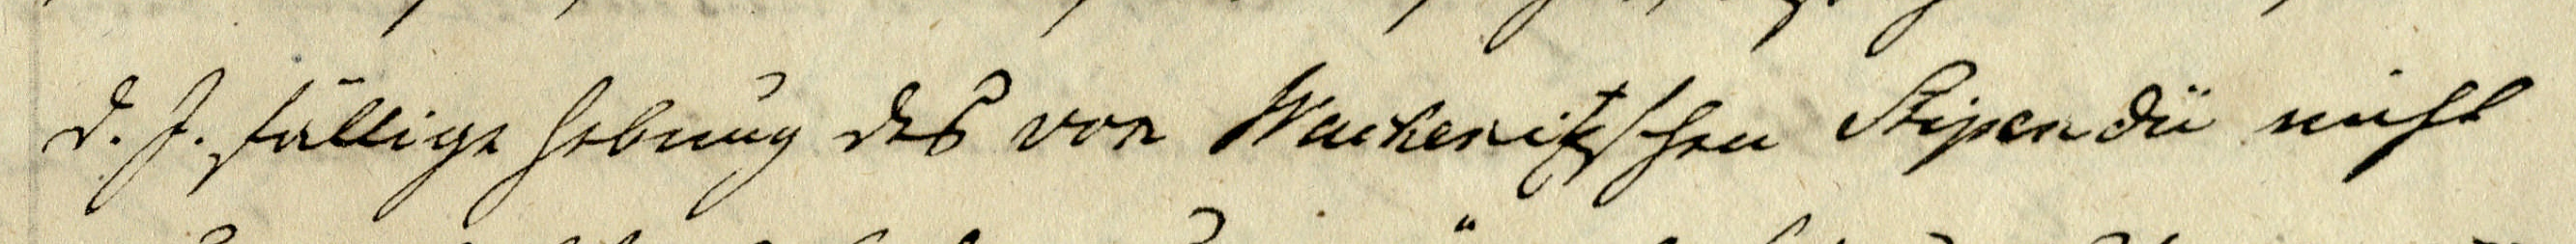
d. J. fällige Hebung des von Wackenitzschen Stipendii nicht
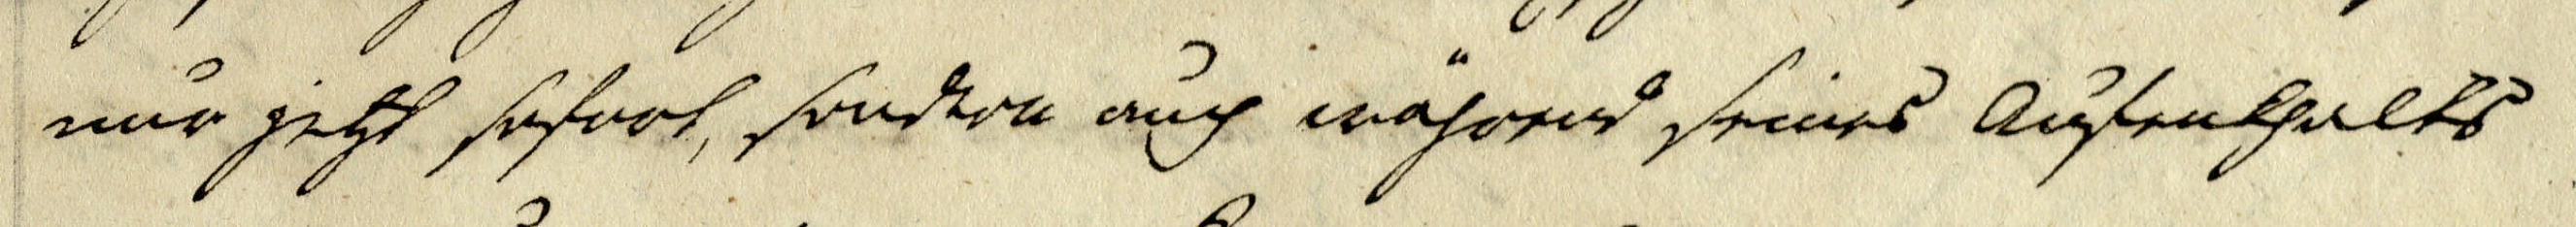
nur jetzt sofort, sondern auch während seines Aufenthalts
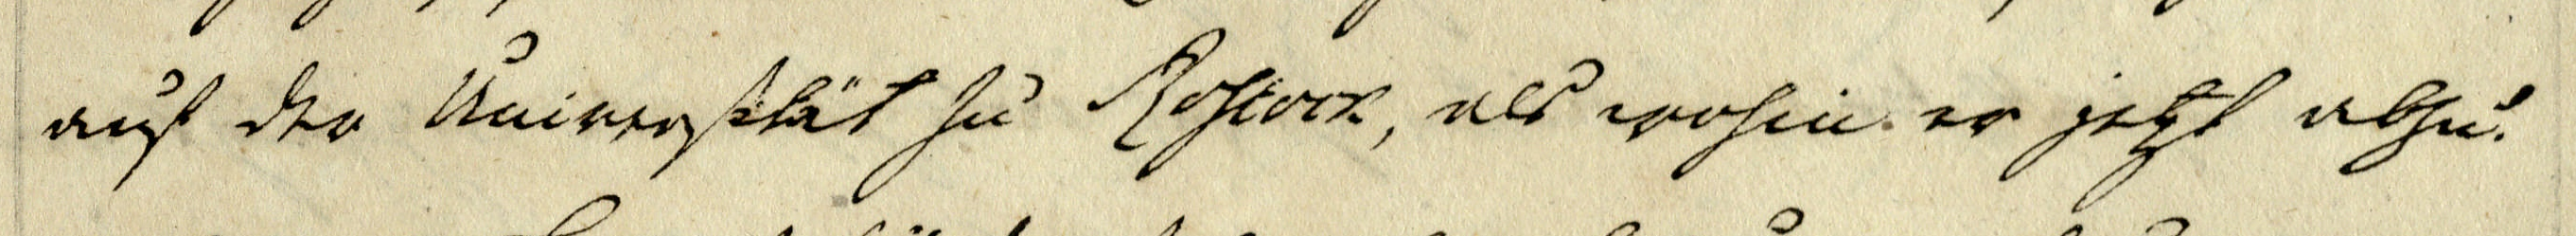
auf der Universität zu Rostock, als wohin er jetzt abzu¬
